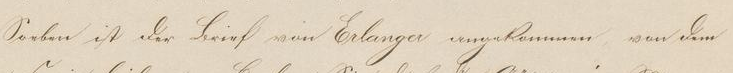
Soeben ist der Brief von Erlanger angekommen, von dem
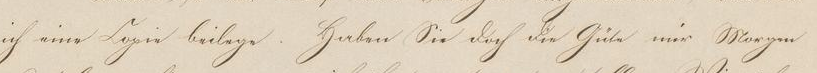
ich eine Copie beilege. Haben Sie doch die Güte mir morgen
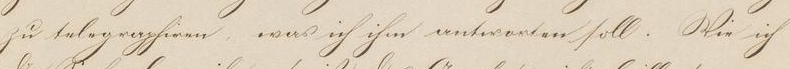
zu telegraphiren, was ich ihm antworten soll. Wie ich
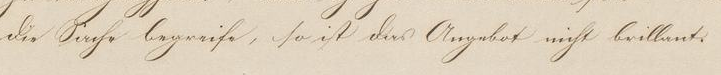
die Sache begreife, so ist dies Angebot nicht brillant.
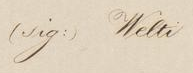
(sig:) Welti
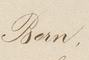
Bern,
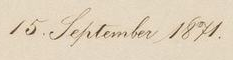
15. September 1871.
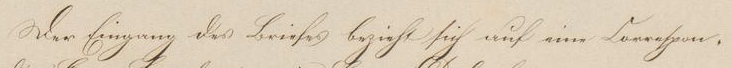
Der Eingang des Briefes bezieht sich auf eine Korrespon-
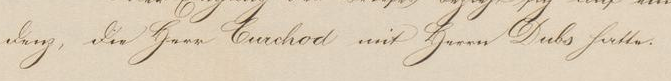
denz, die Herr Curchod mit Herrn Dubs hatte.
